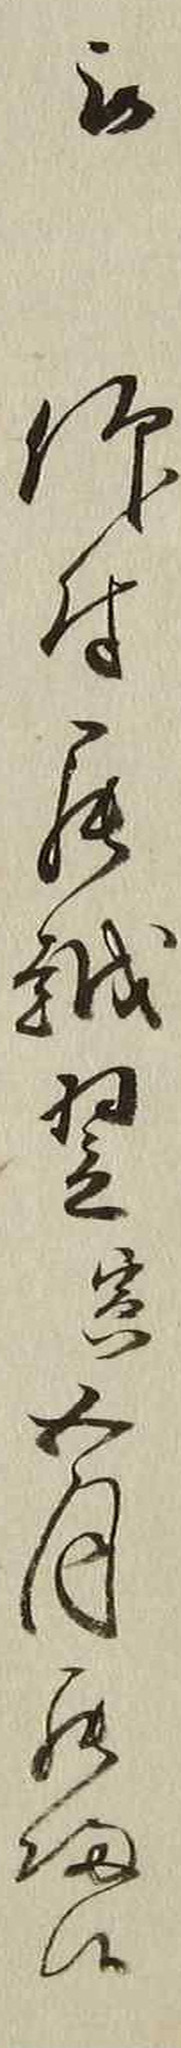被仰付罷越翌寅五月罷帰候
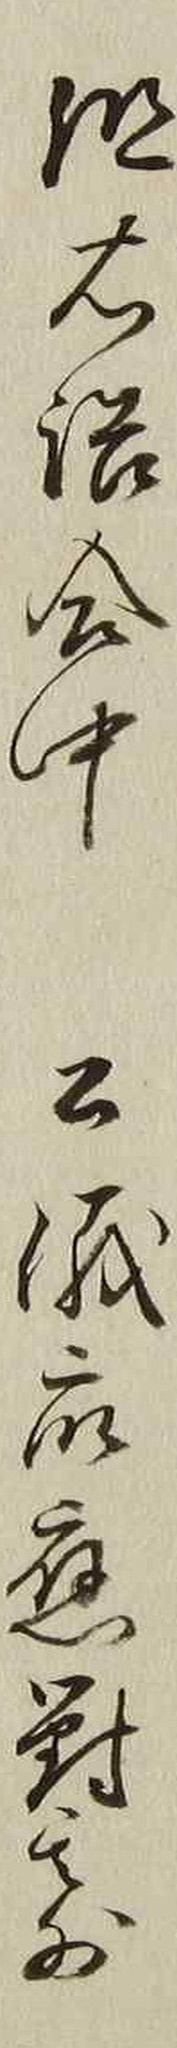但右詰合中公儀衆応対其外
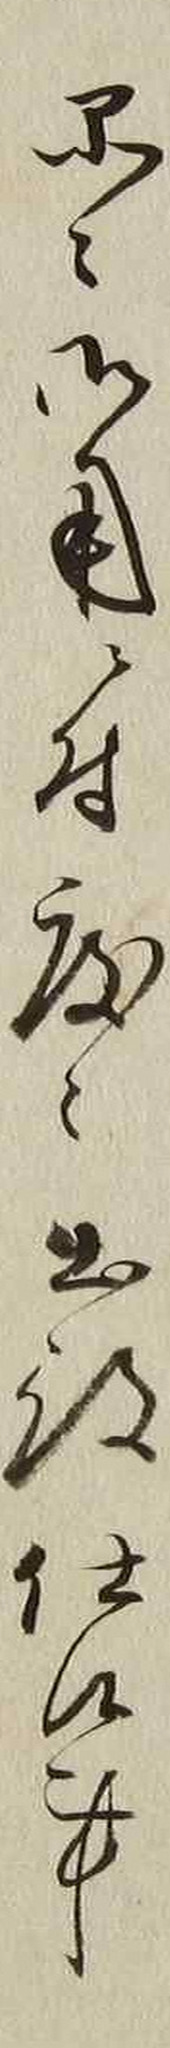品々御用ニ付度々出役仕候事
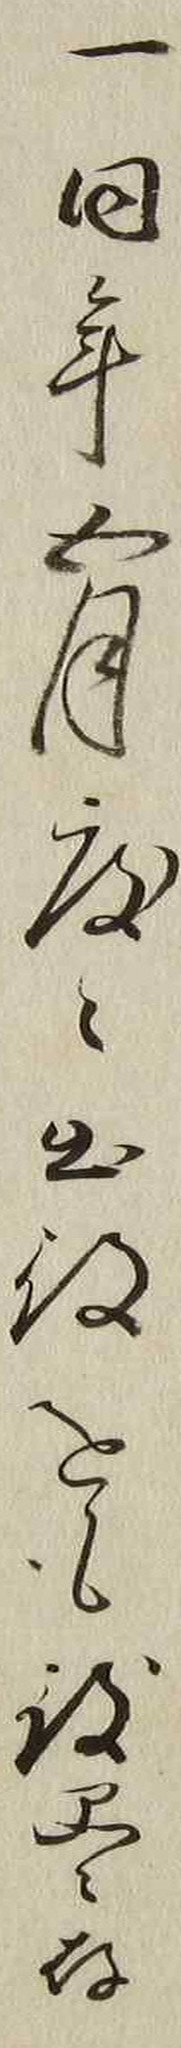一同年五月度々出役をも致品々存
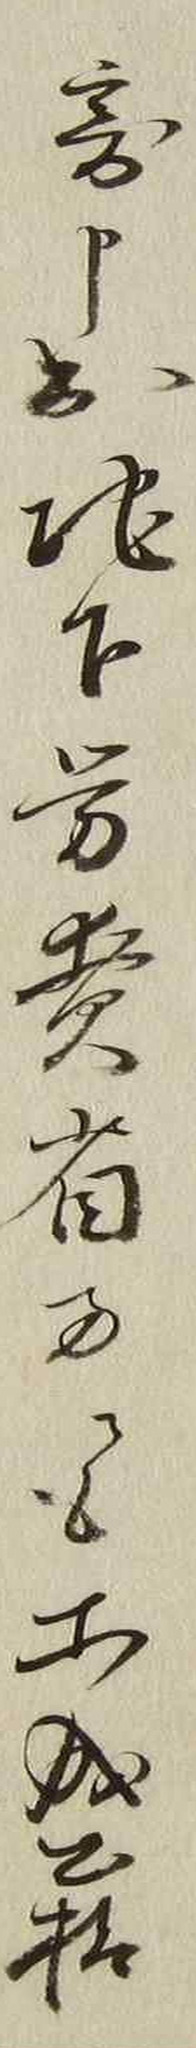寄申出地下労費省方ニも相成出精
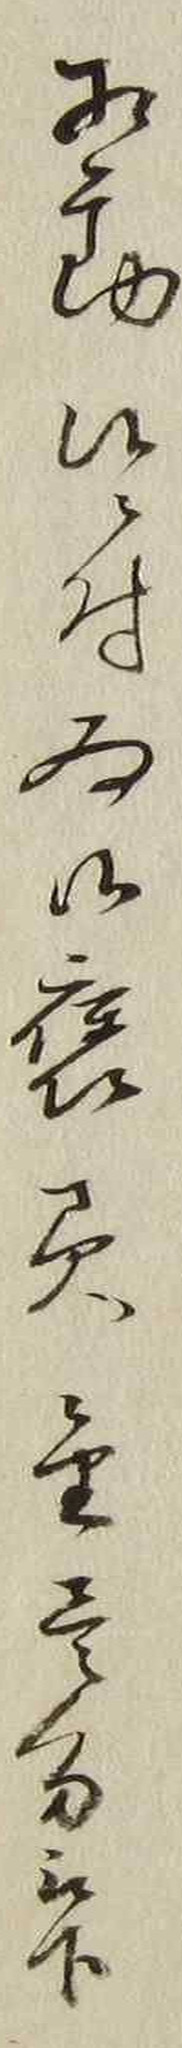相勤候ニ付為御褒美金壱分被下
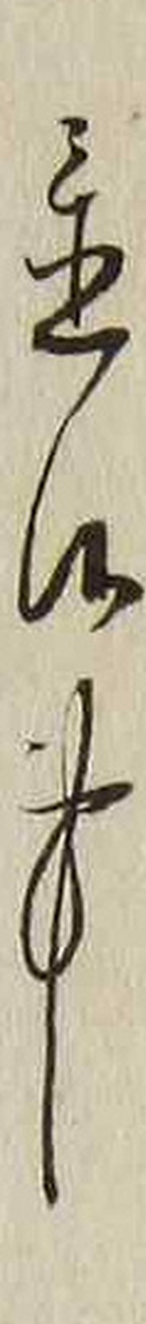置候事
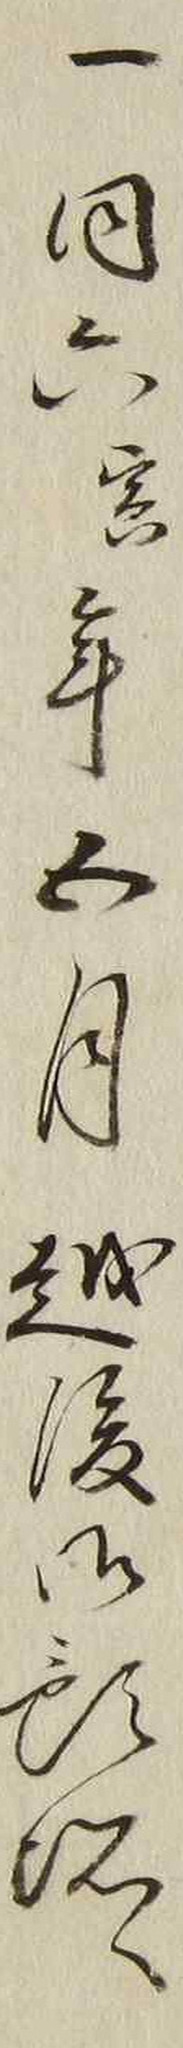一同六寅年五月越後御預所へ
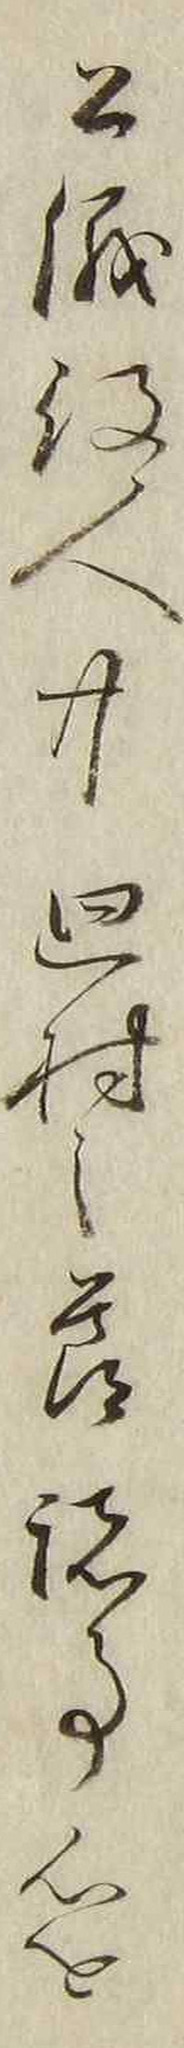公儀役人共廻村之節諸事心を
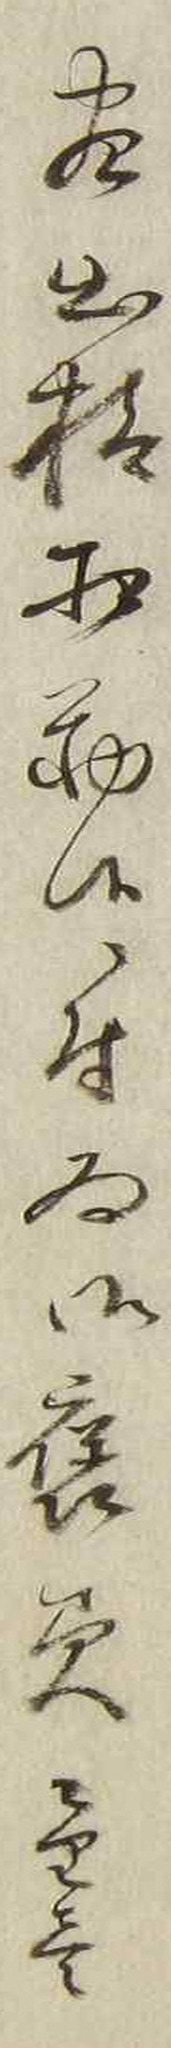尽出精相勤候ニ付為御褒美金壱

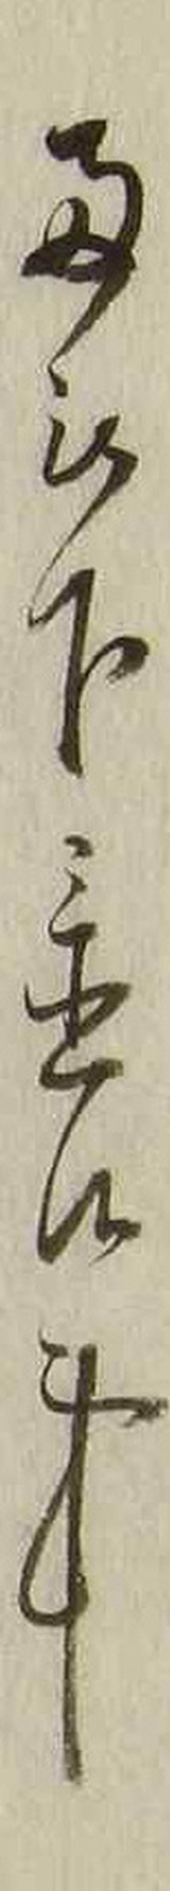両被下置候事
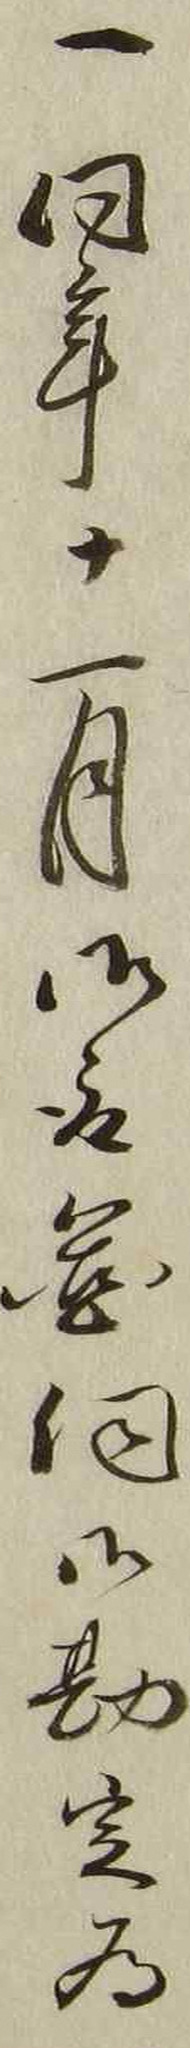一同年十一月御取箇伺御勘定為
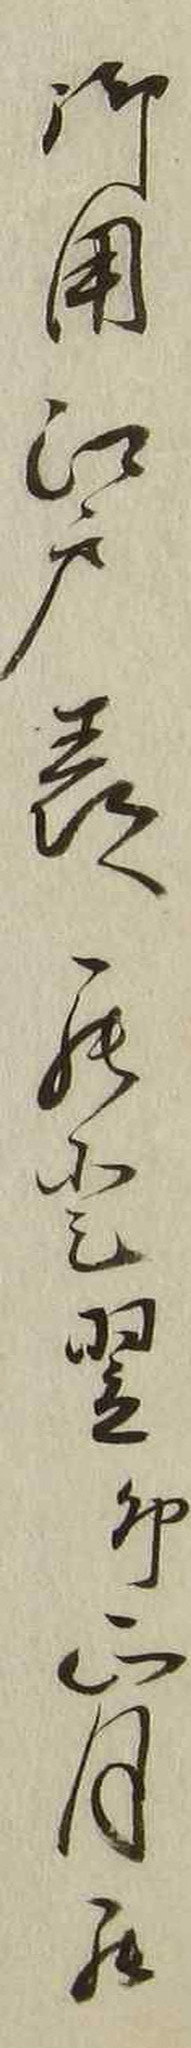御用江戸表へ罷登翌卯正月罷
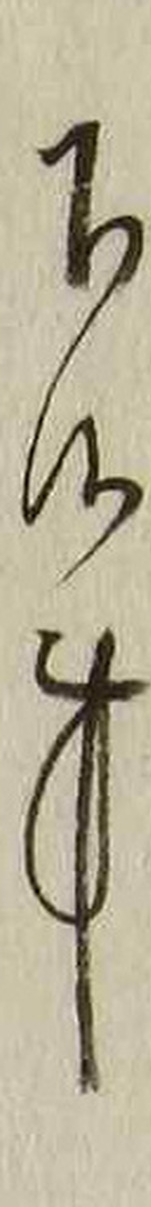下置事
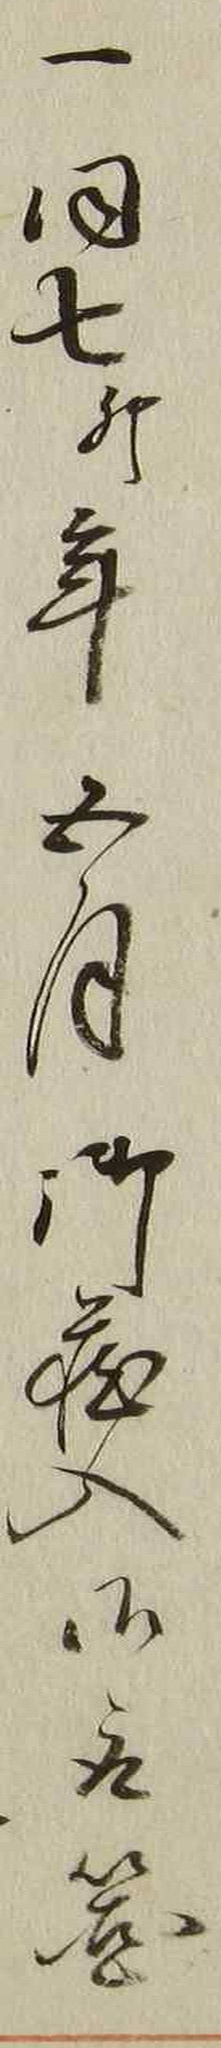一同七卯年五月御蔵入御取箇
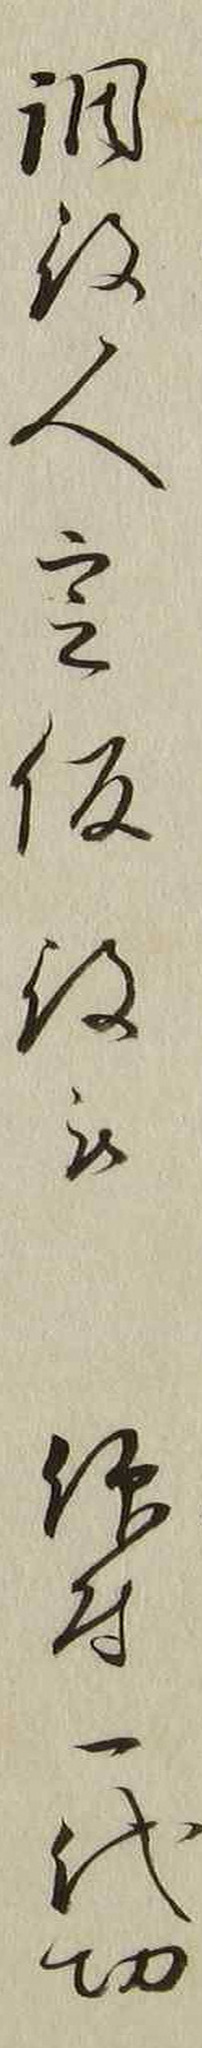調役人定仮役被仰付一代切
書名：諸士系譜　巻之52　に之部3
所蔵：会津若松市立会津図書館
